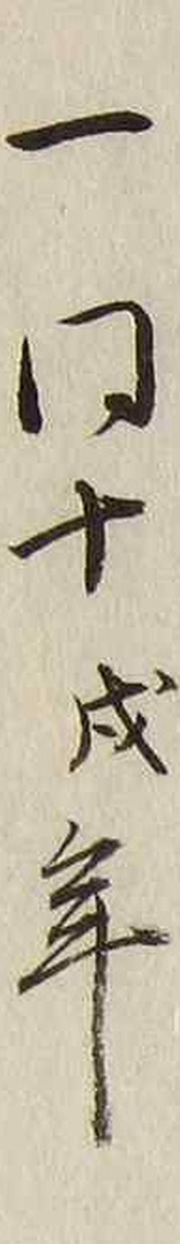一同十戌年

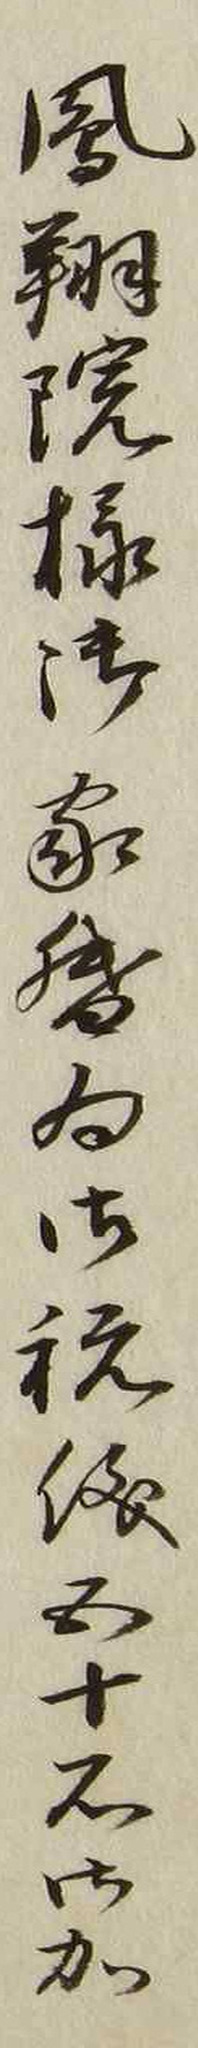鳳翔院様御家督為御祝儀五十石御加
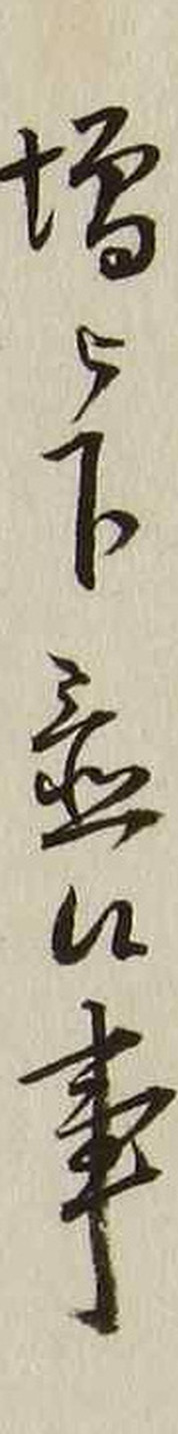増被下置候事
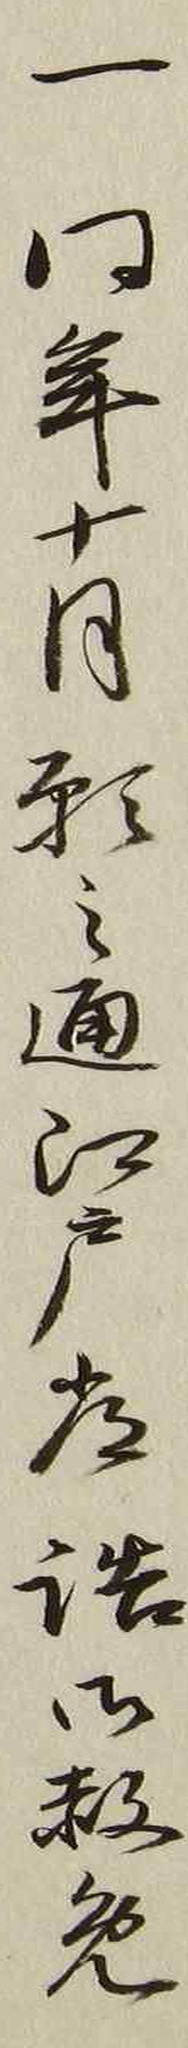一同十月願之通江戸常詰御赦免
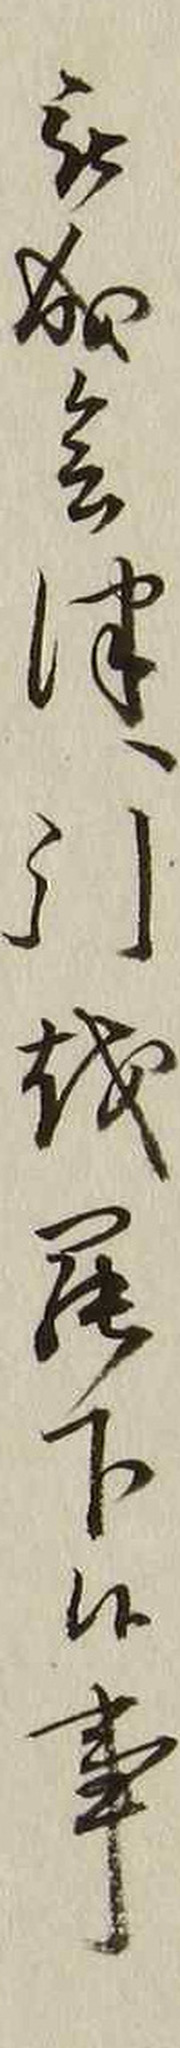被成会津へ引越罷下候事
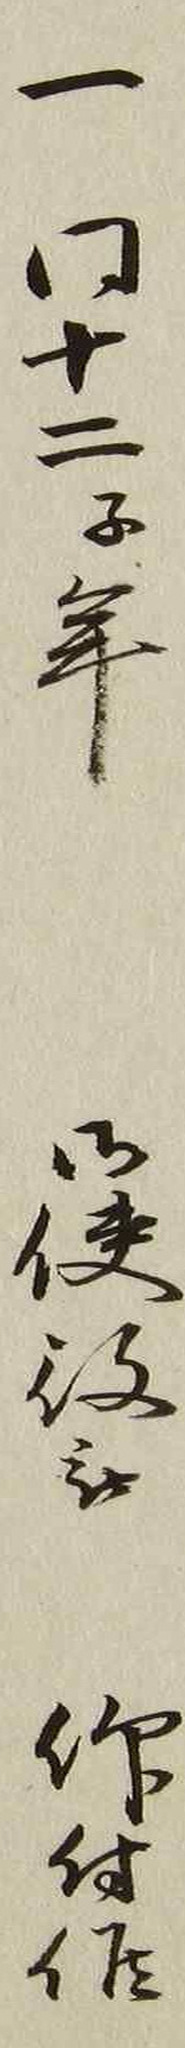一同十二子年御使役被仰付候
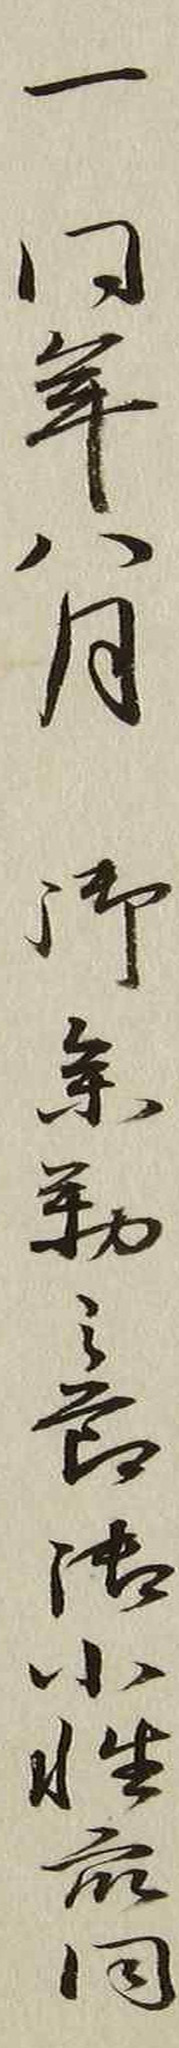一同年八月御参勤之節御小姓衆同
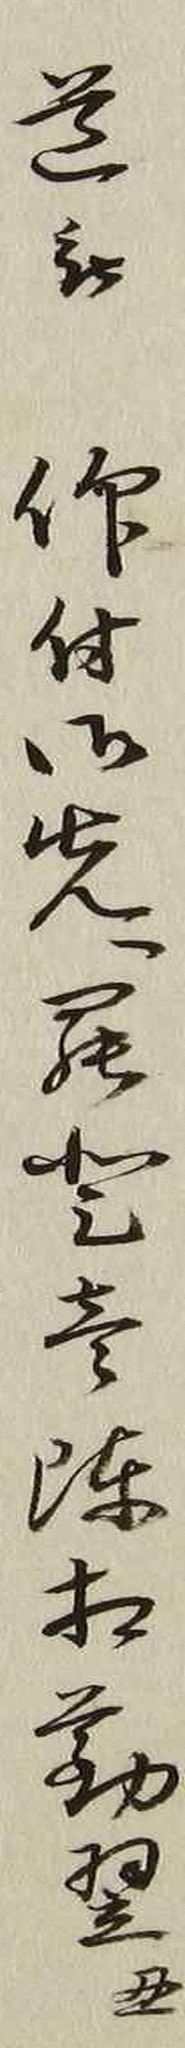道被仰付御先へ罷登壱陣相勤翌丑
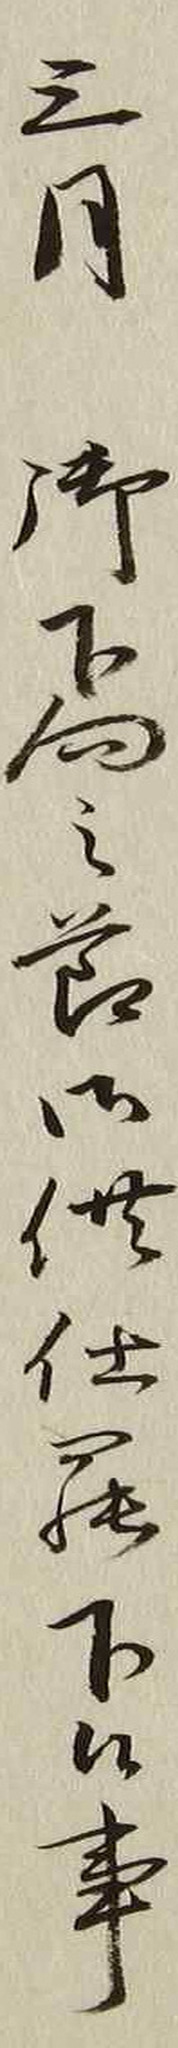三月御下向之節御供仕罷下候事
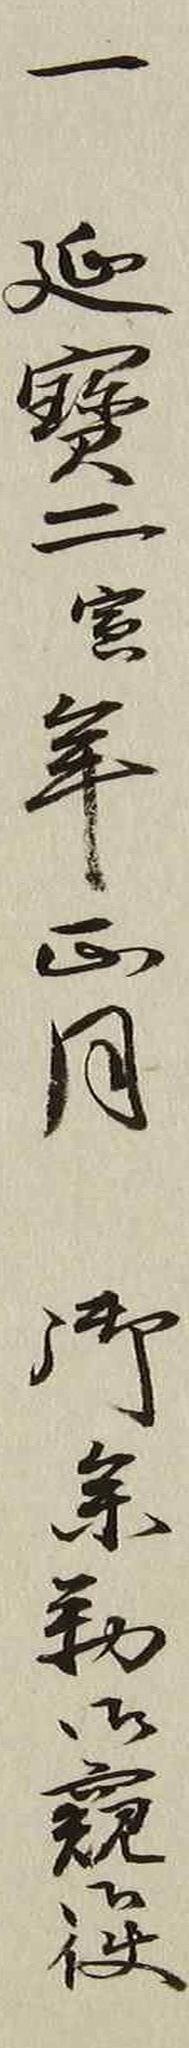一延宝二寅年正月御参勤御窺御使
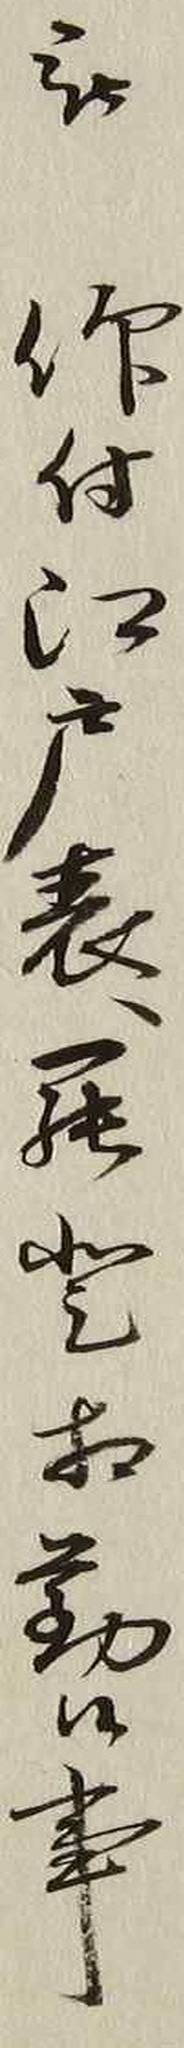被仰付江戸表へ罷登相勤候事
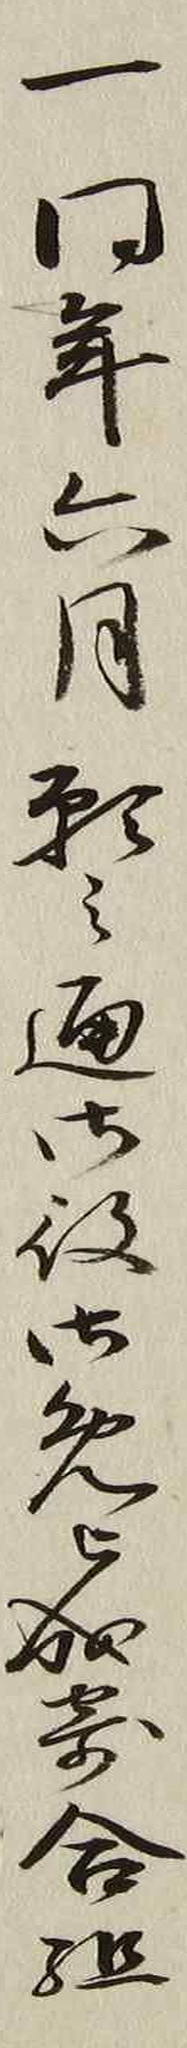一同年六月願之通御役御免被成寄合組
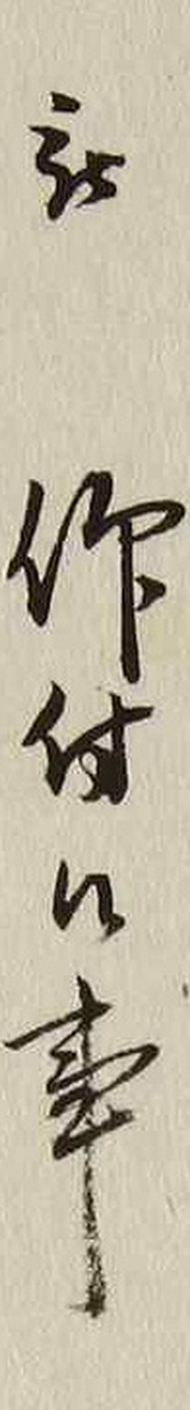被仰付候事
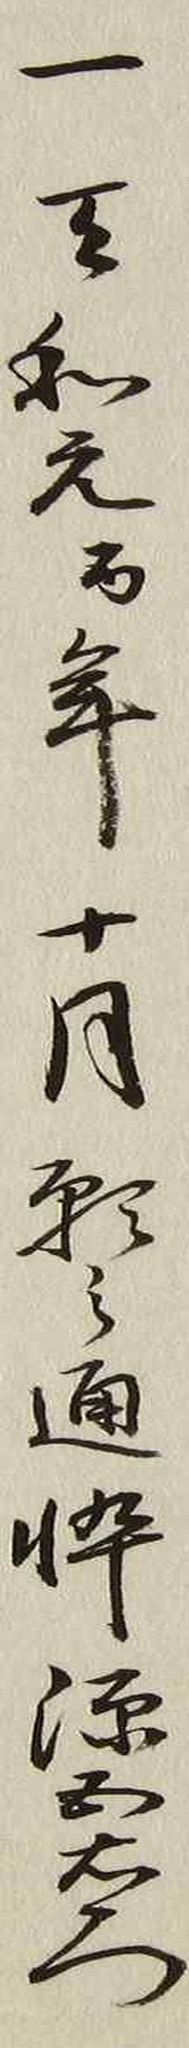一天和元酉年十月願之通忰源五右衛門
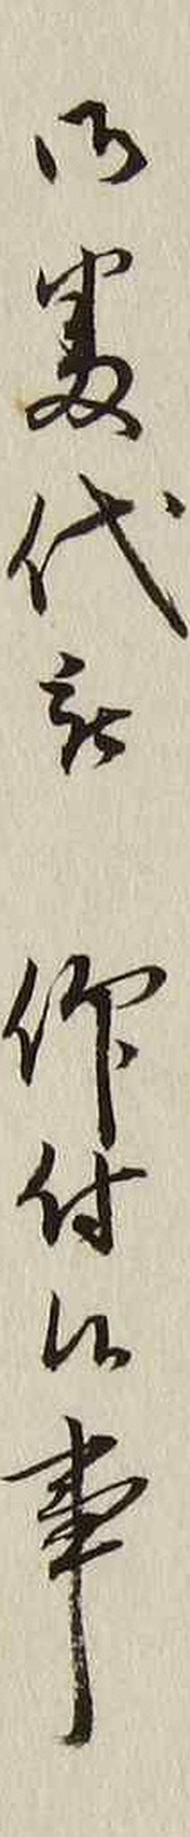御番代被仰付候事
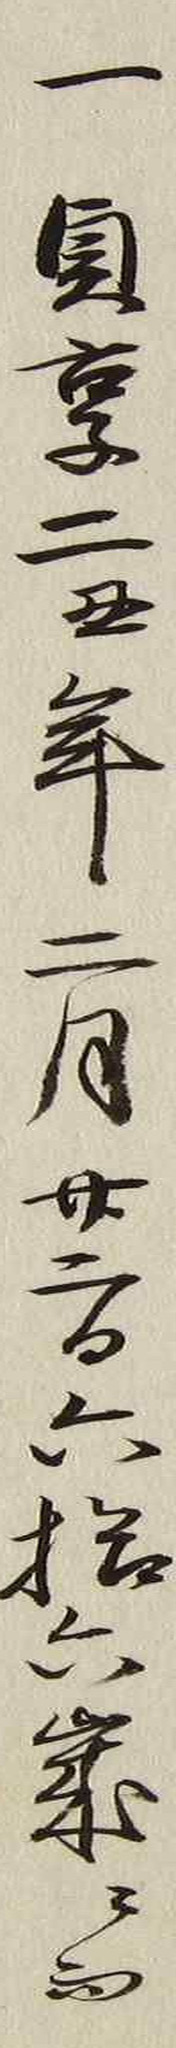一貞享二丑年二月廿二日六拾六歳ニ而
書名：諸士系譜　巻之160　な之部2
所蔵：会津若松市立会津図書館
